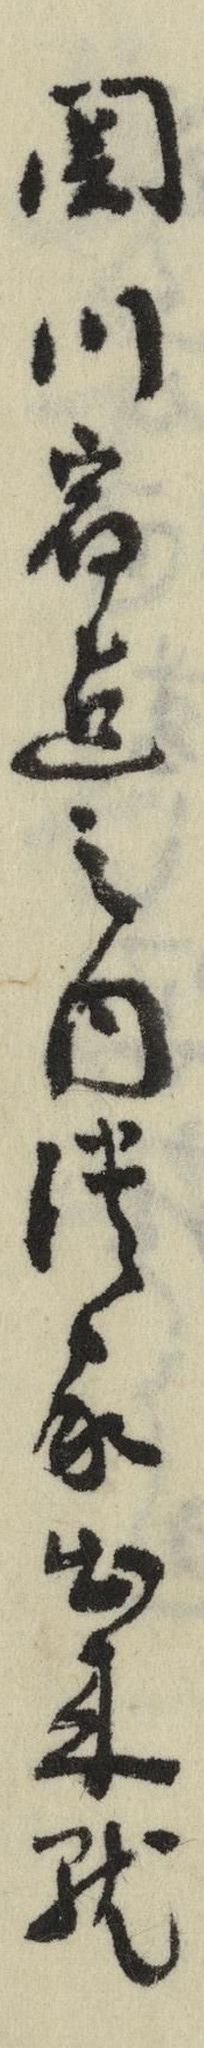関川宿迄之内潰家出来就
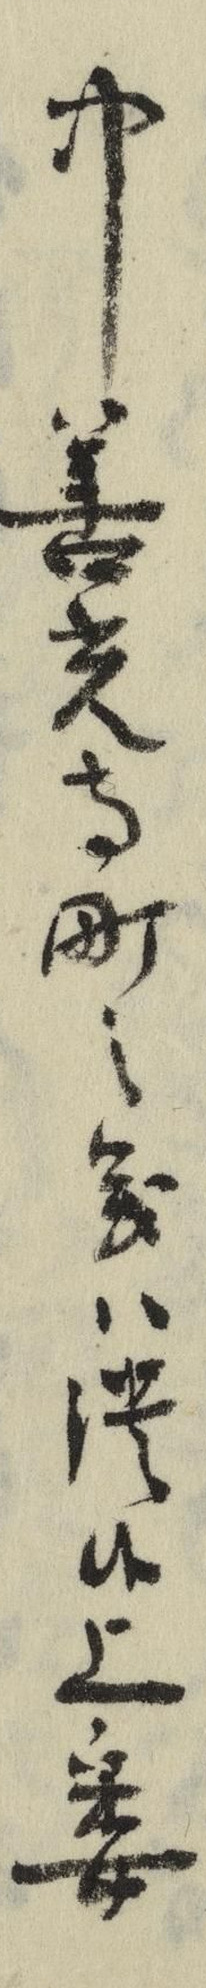中善光寺町の義ハ潰候上悉
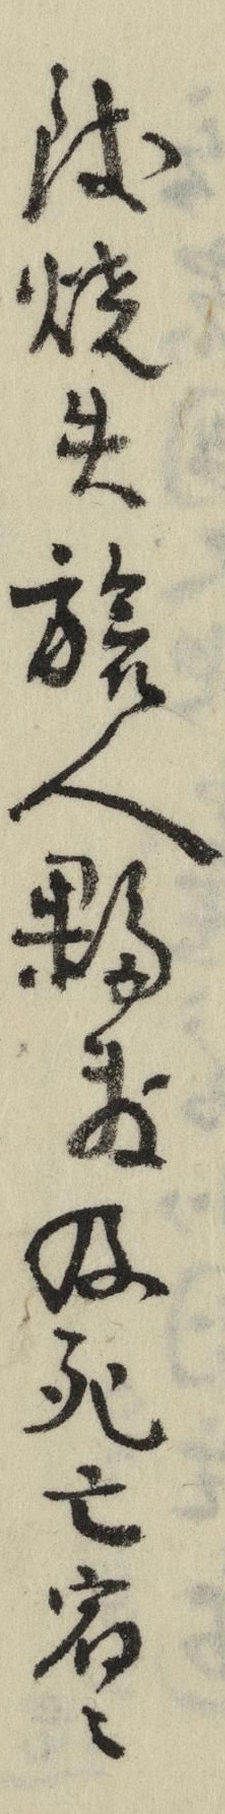致焼失旅人夥敷及死亡宿々
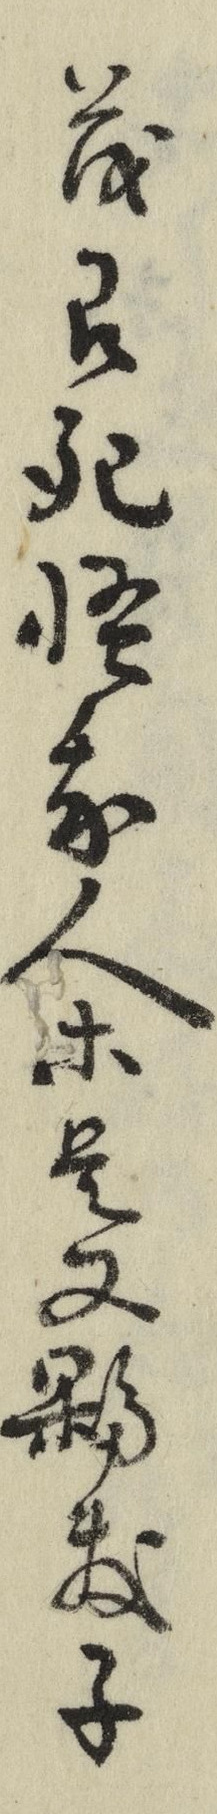も即死怪我人等是又夥敷子
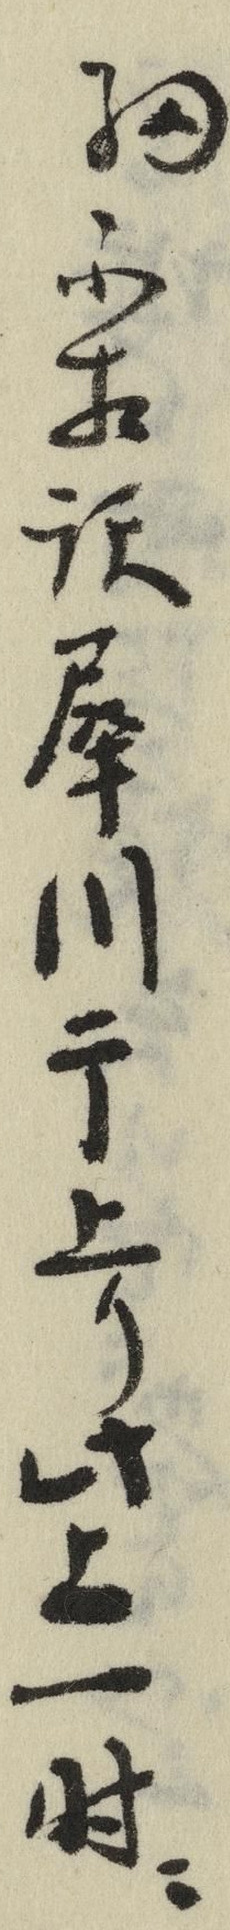細不相訳犀川干上り此上一時二
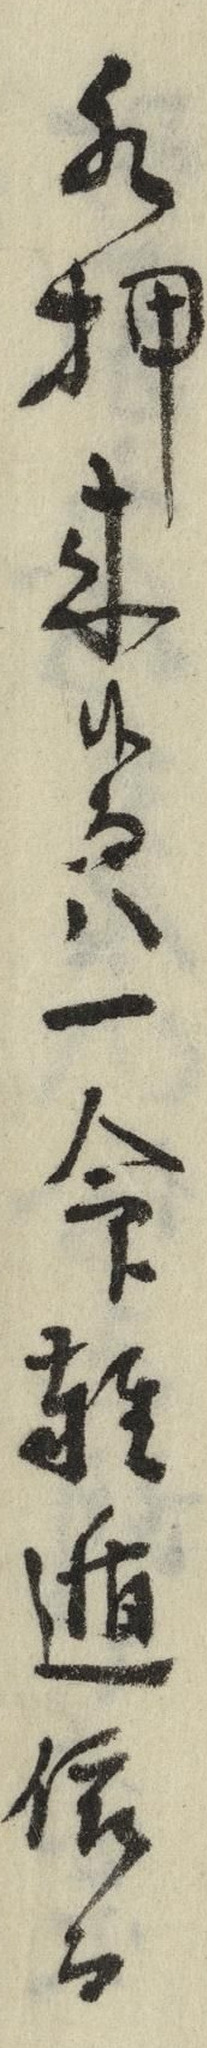水押来候而ハ一命難遁依而
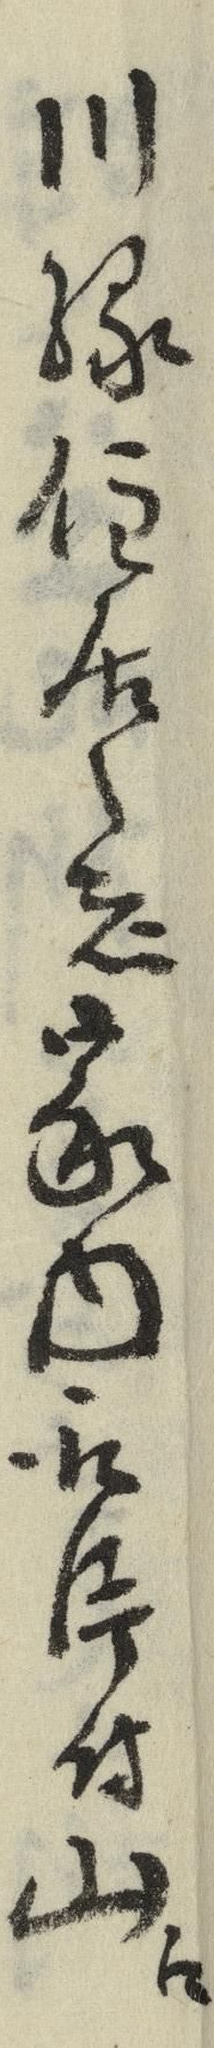川縁住居之者家内取片付山江
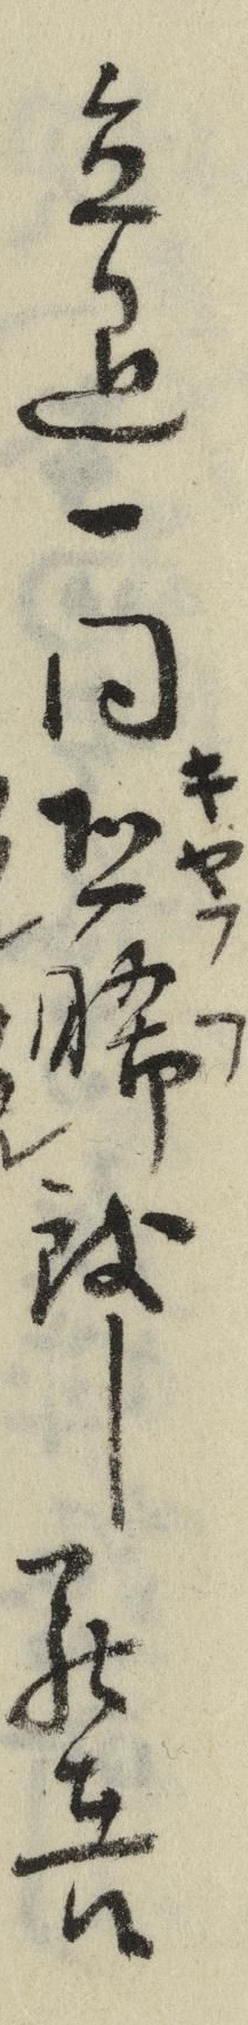立退一同恐怖致し罷在候
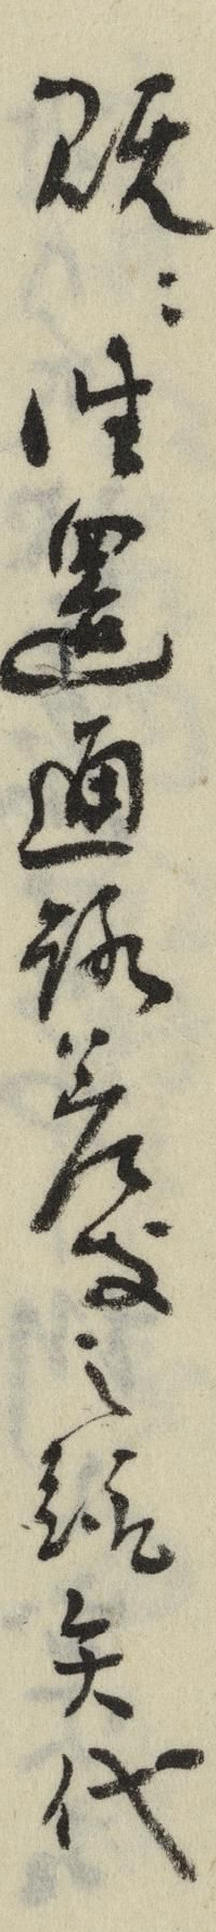既ニ往還通路差支之趣矢代
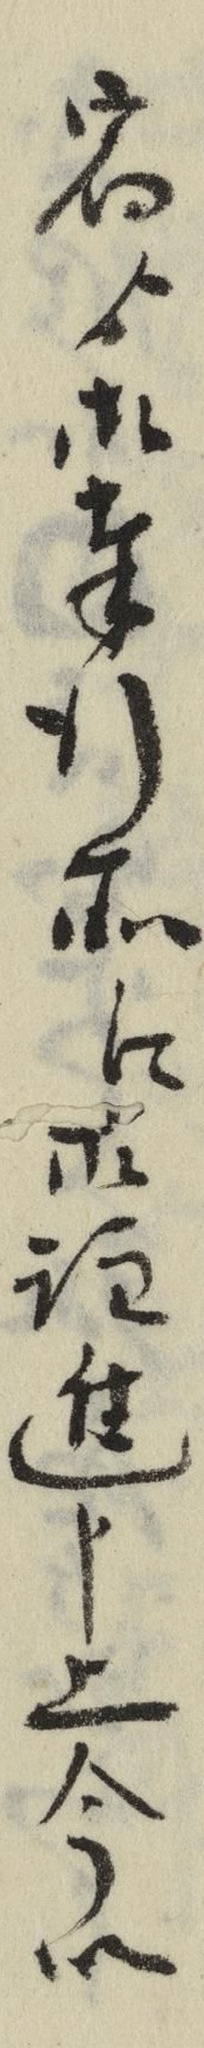宿ゟ御奉行所江御注進申上今以
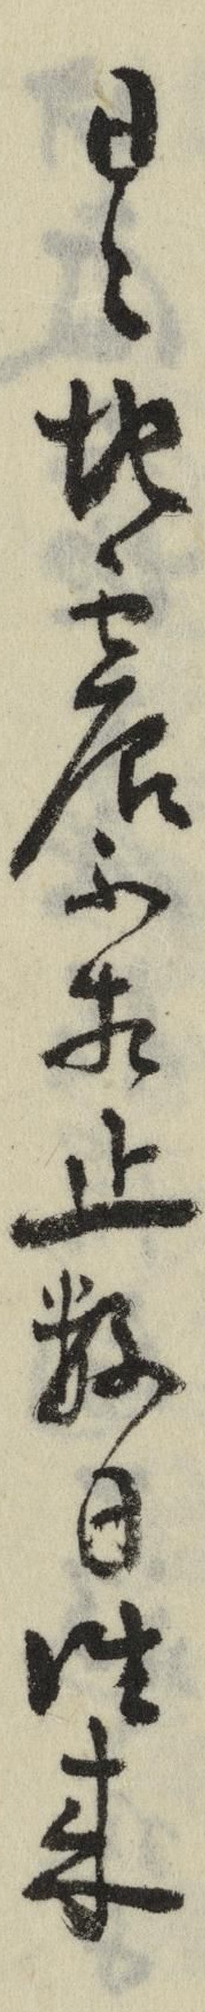日々地震不相止数日往来
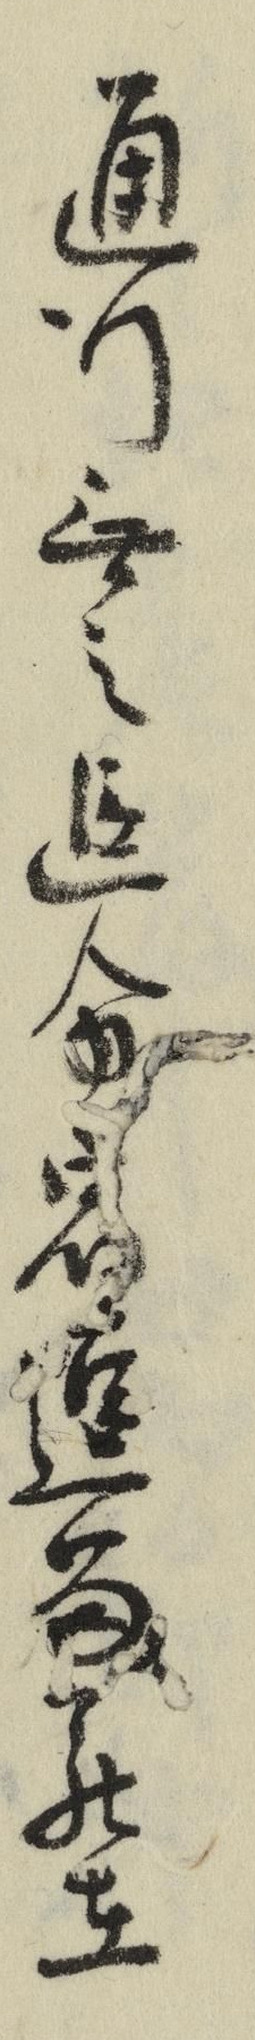通行無之追分宿逗留罷在
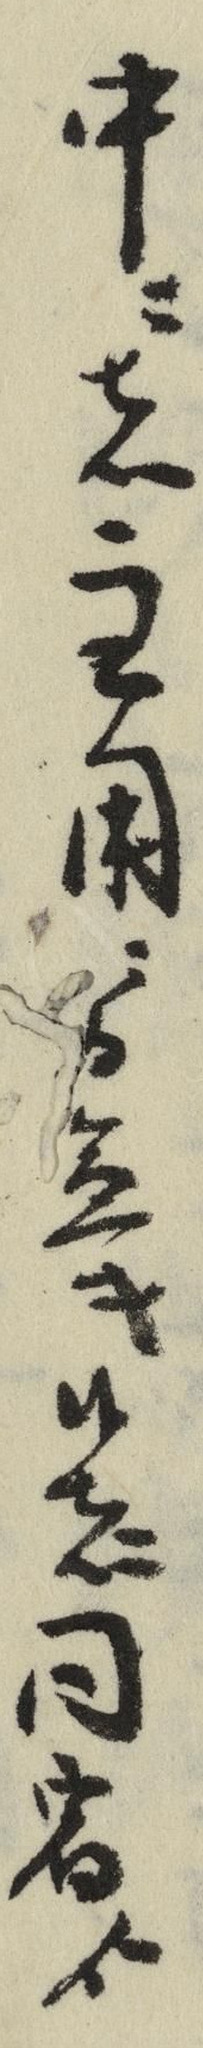中二者主用二而急キ候者同宿ゟ
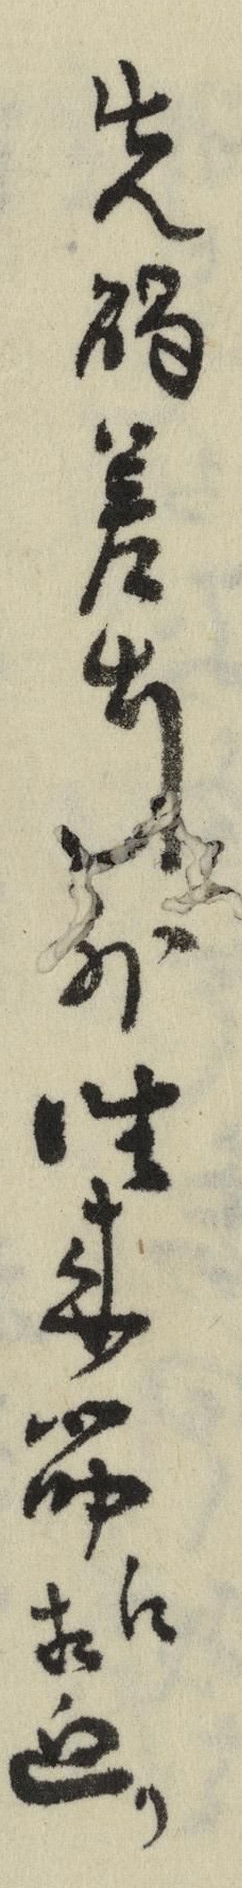先触差出し外往来筋江相廻り
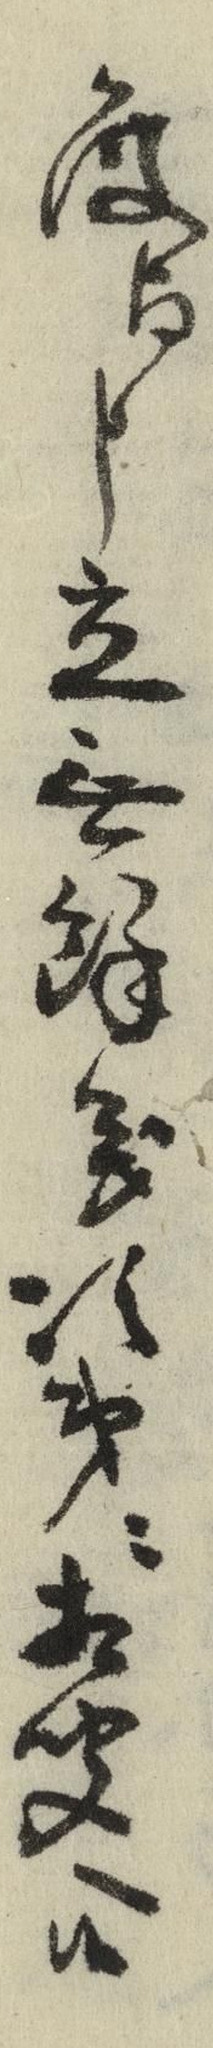度と申立無余義次第二相聞へ候
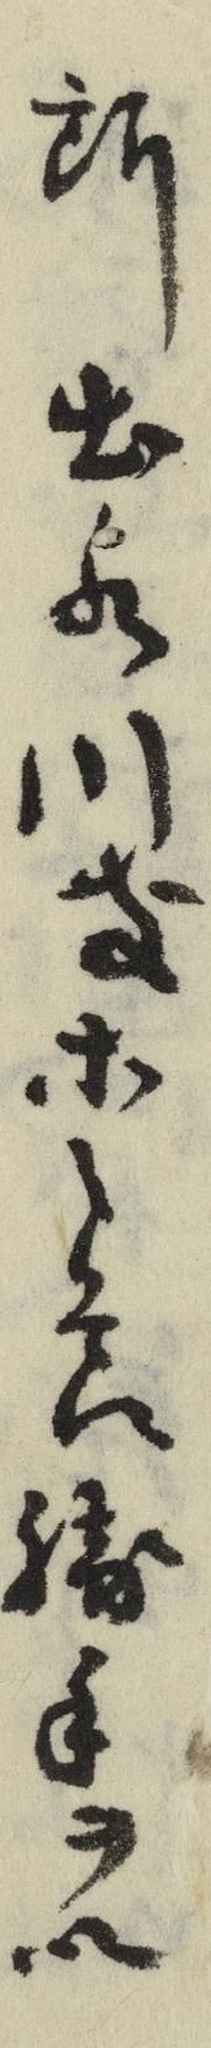所出水川支等之節勝手ヲ以
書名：信州大地震一件之冩　丁未弘化四年三月吉日
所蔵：東京大学地震研究所図書室 Earthquake Research Institute Library, The University of Tokyo, JAPAN
